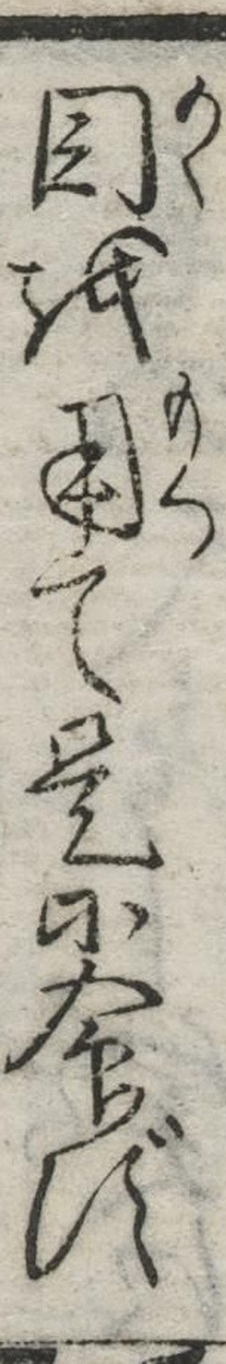目を用て是に命ず
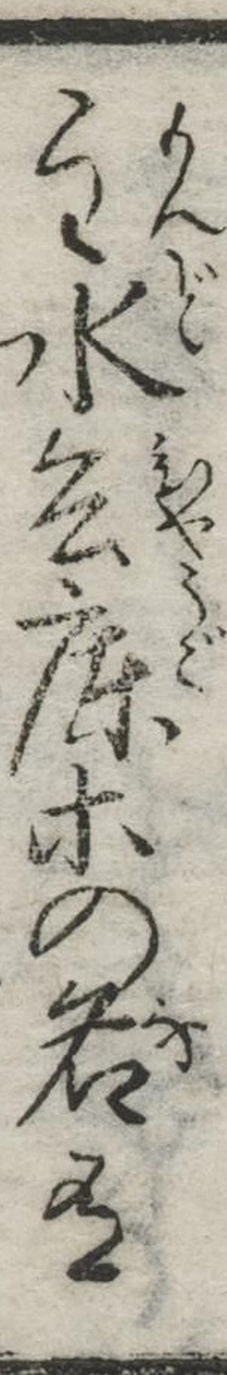主水兵庫この名有
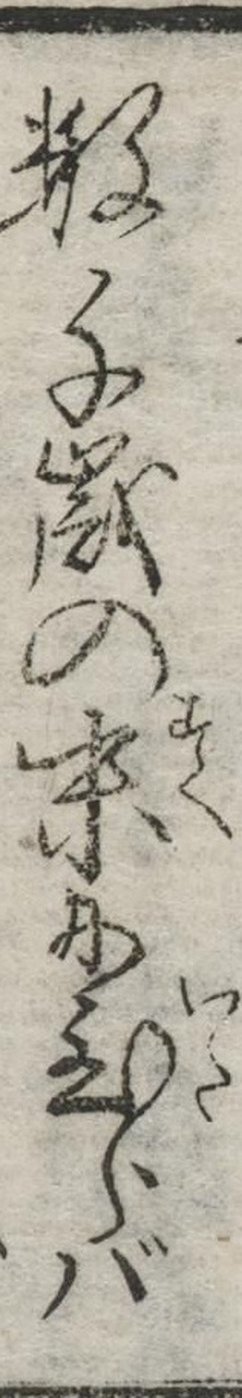数千歳の末に至らば
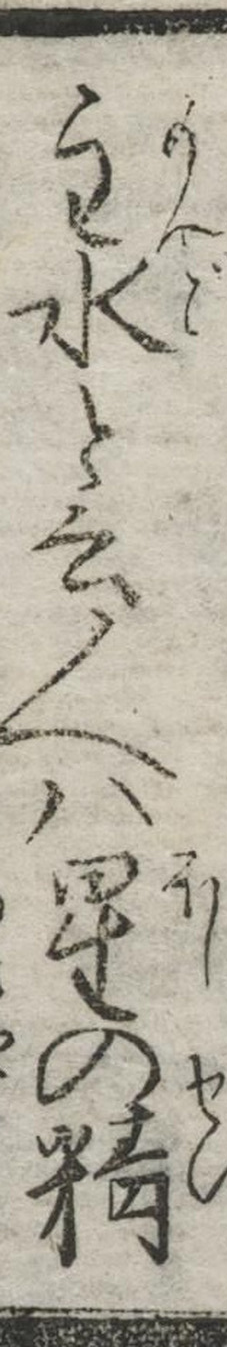主水と云人は星の精
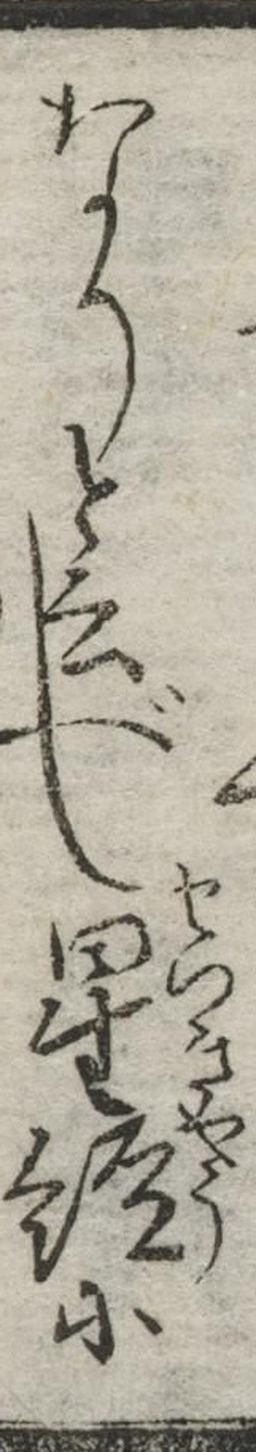なりと云べし星経に
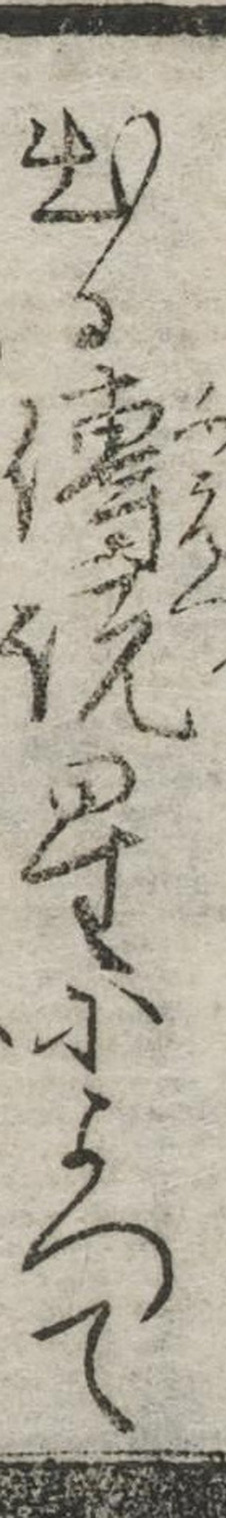出る傳説星によつて
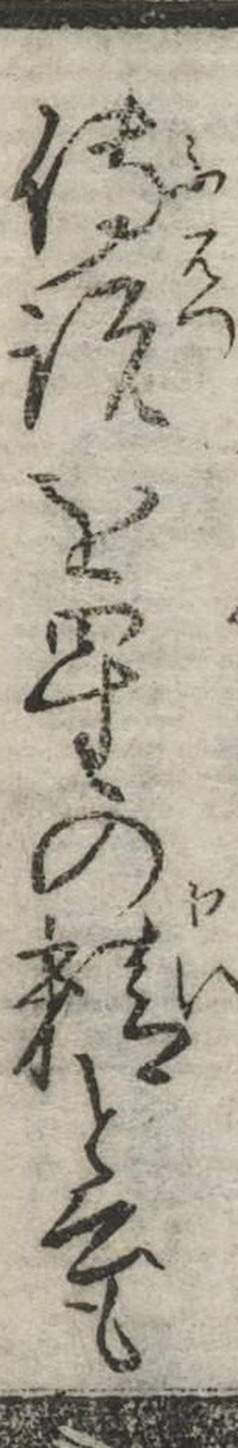傳説を星の精と云も

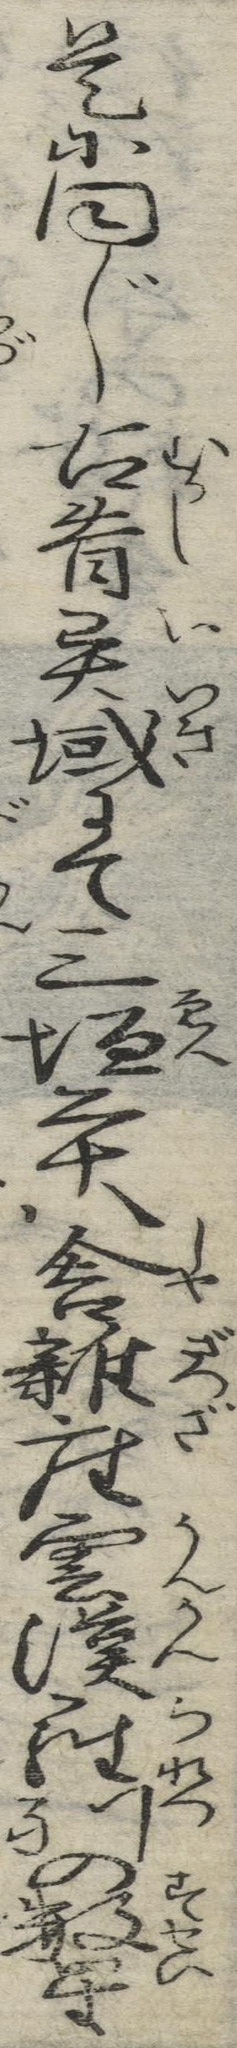是に同じ古有異域にて三垣二十八舎雑座雲漢羅列の数星
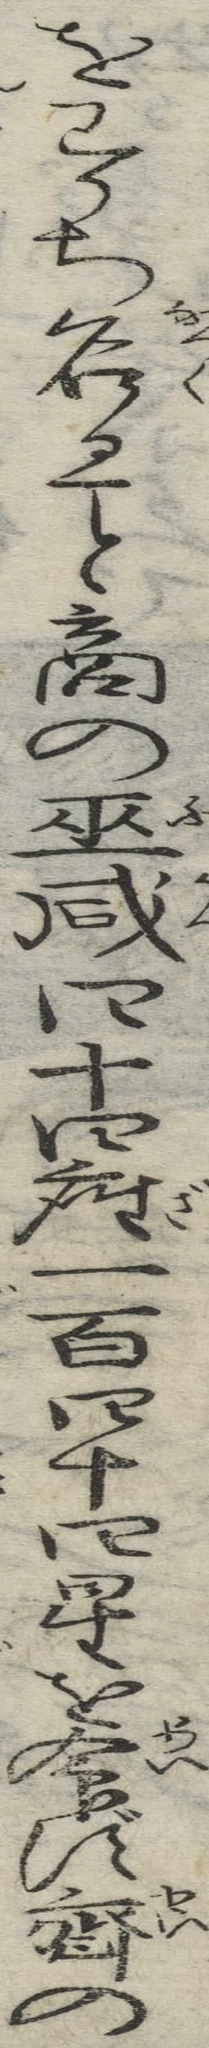をわかち名ること商の巫咸四十四座一百四十四星を命ず斉の
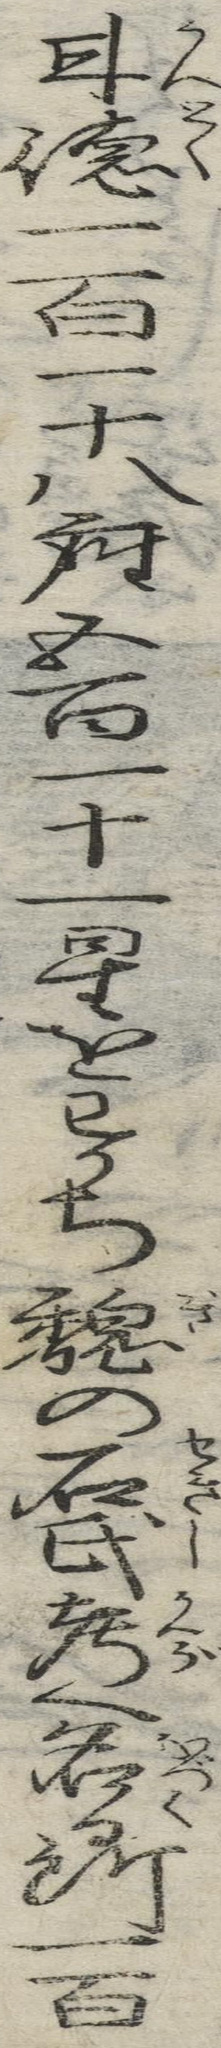甘徳一百一十八座五百一十一星をわかち魏の石氏考へ名る所一百
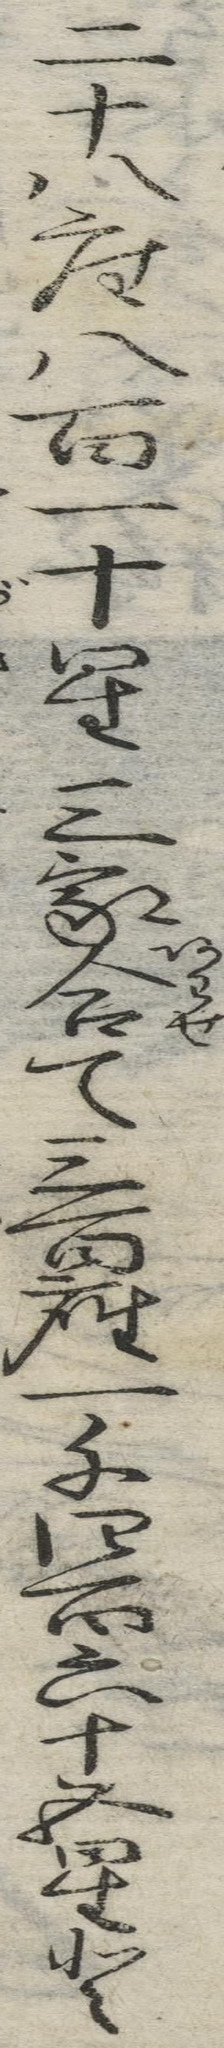二十八座八百一十星三家合て三百座一千四百六十五星と
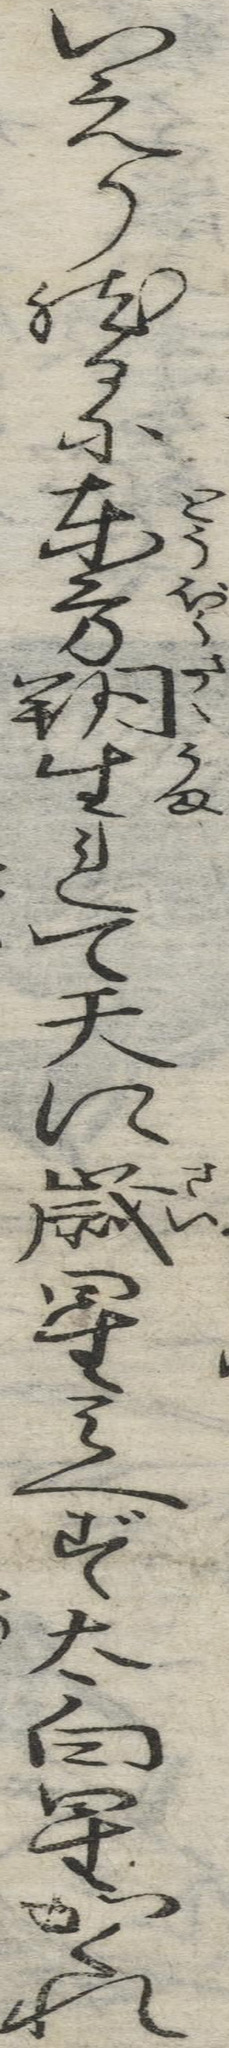いえり然るに東方朔生れて天に歳星きへず太白星かくれ
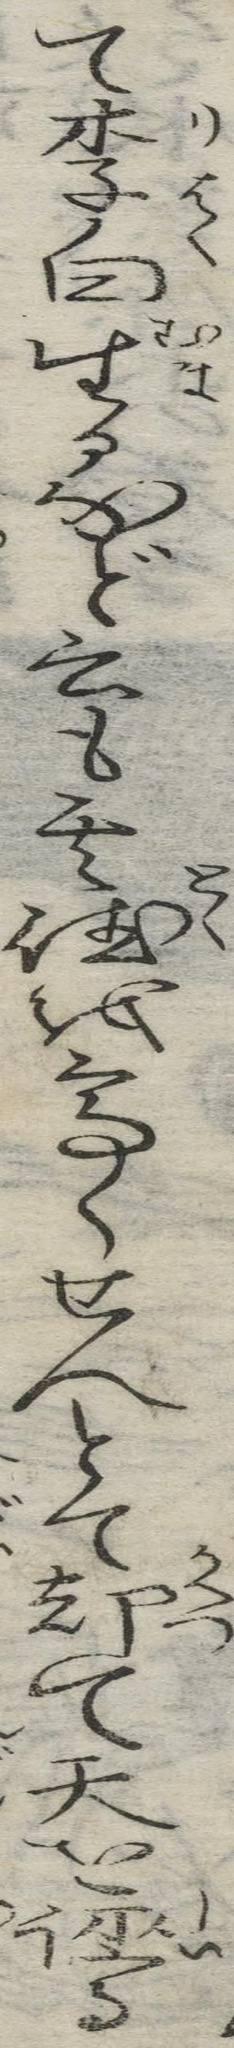て李白生るなど云も其徳を高くせんとて却て天を誣る
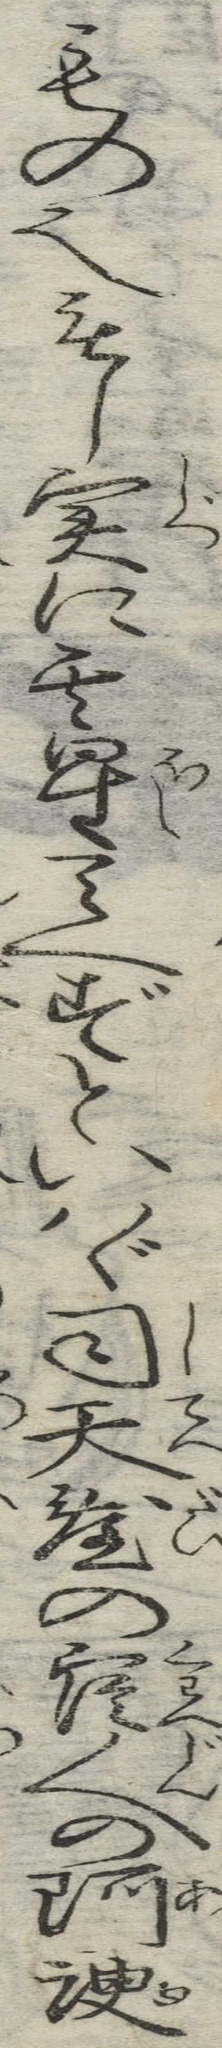もの也もし実に其星きへずといはゞ司天臺の官人の阿諛
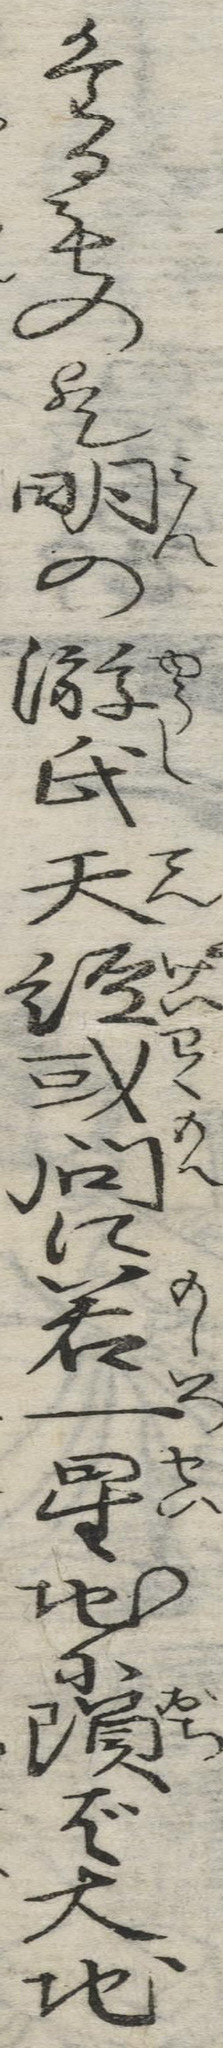たるもの是明の游氏天経或問に若一星地に隕ず大地
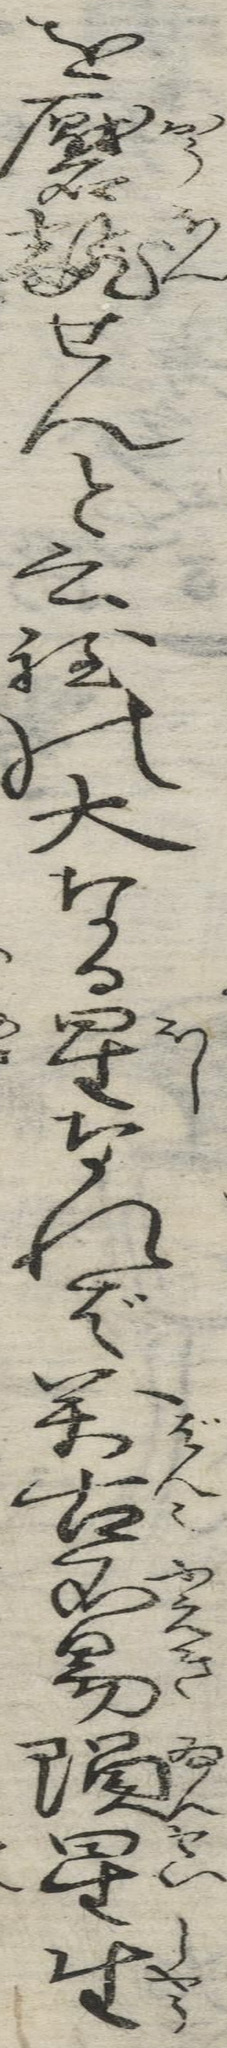を壓飜せんと云狂の大なる星なれば萬古不易隕星生
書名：訓蒙天地辨　人
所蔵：東京大学地震研究所図書室 Earthquake Research Institute Library, The University of Tokyo, JAPAN
